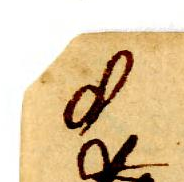8
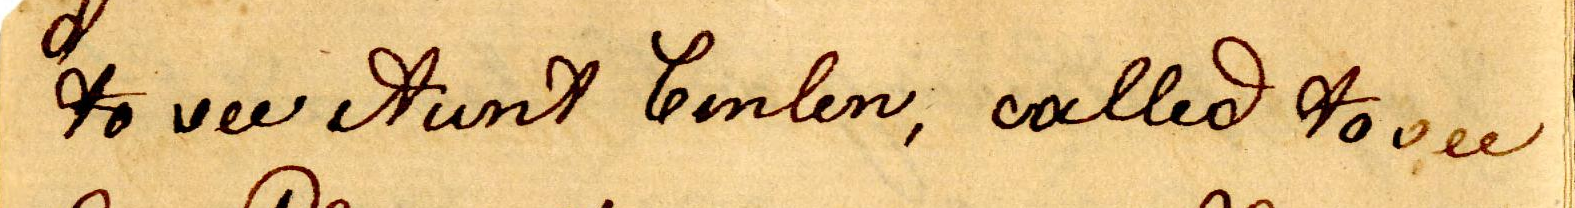to see Aunt Emlen, called to see
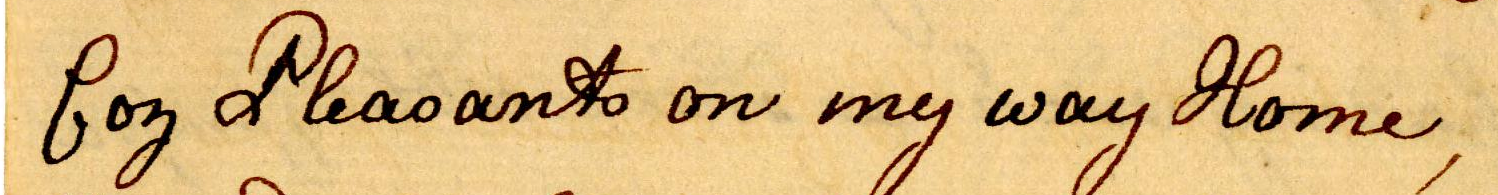Coz Pleasants on my way Home,
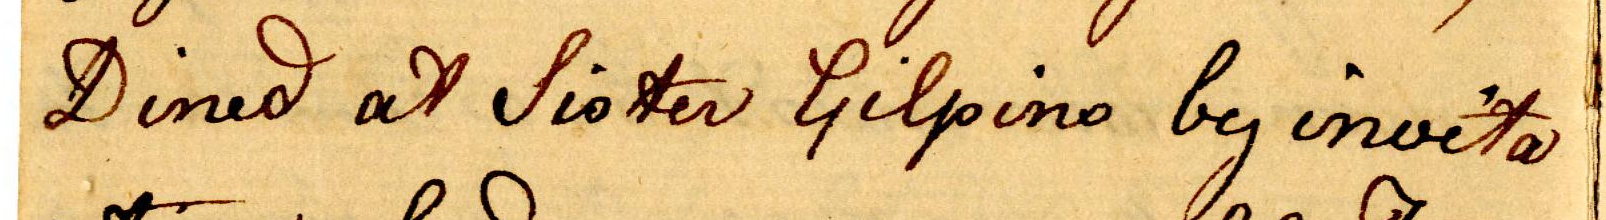Dined at Sister Gilpins by invita
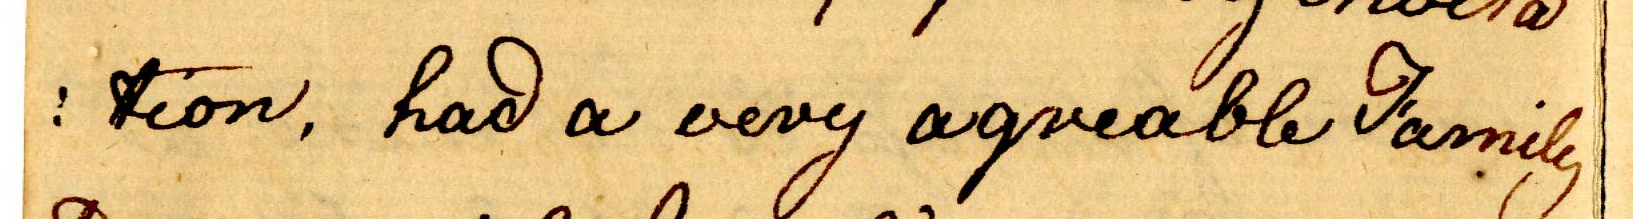-tion, had a very agreable Family
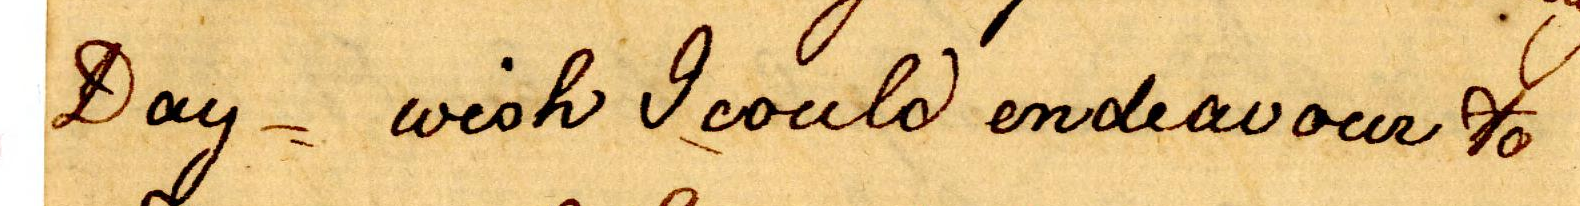Day- wish I could endeavour to
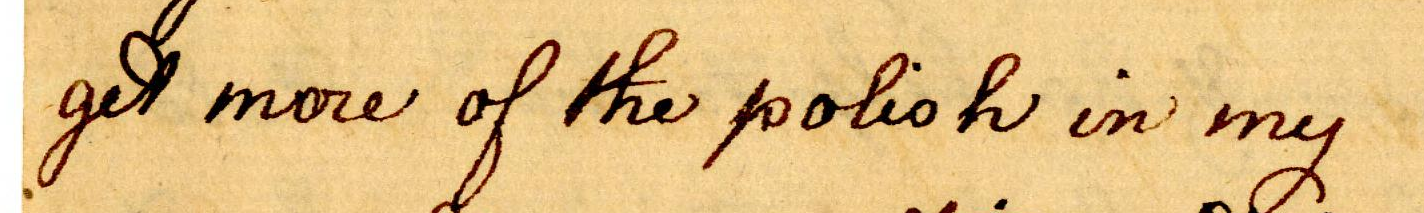get more of the polish in my
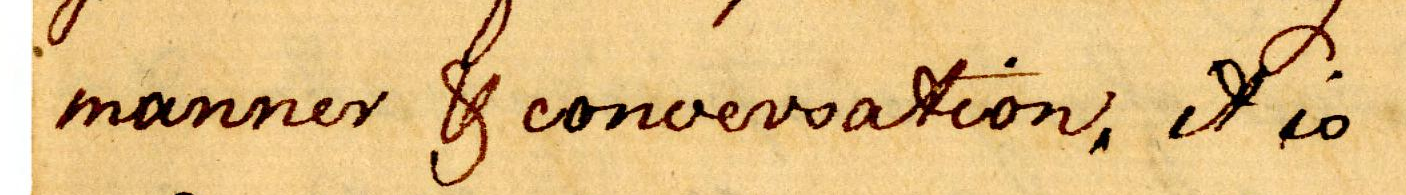manner & conversation, it is
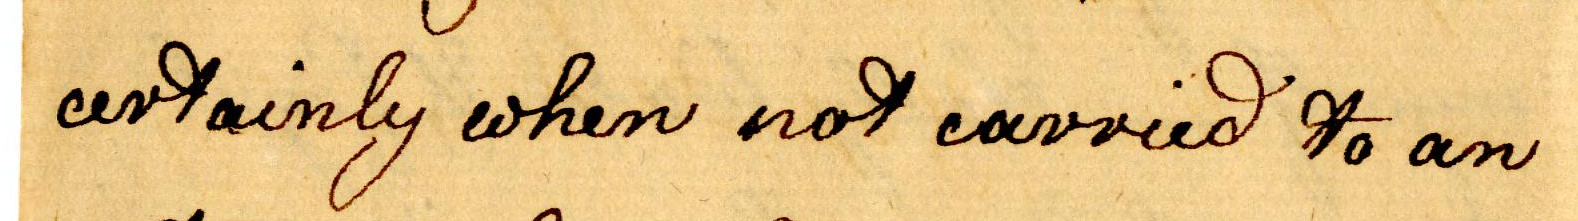certainly when not carried to an
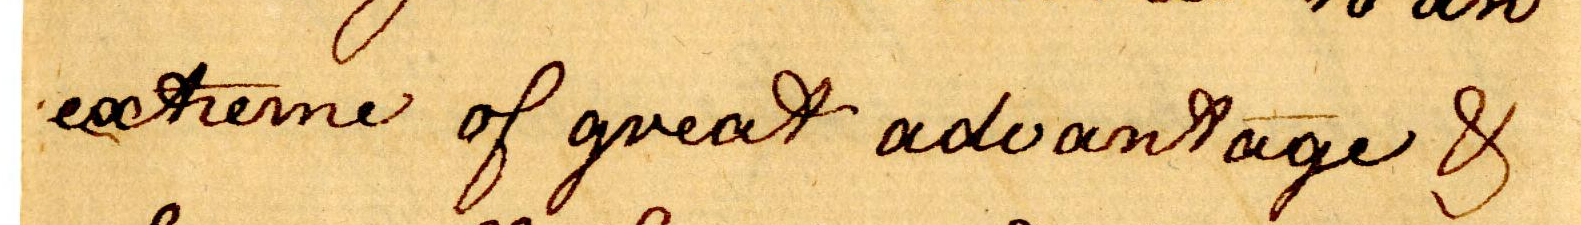extreme of great advantage &
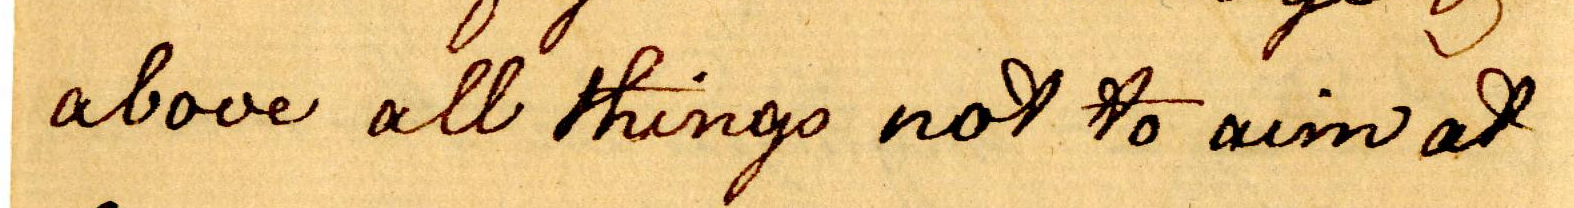above all things not to aim at
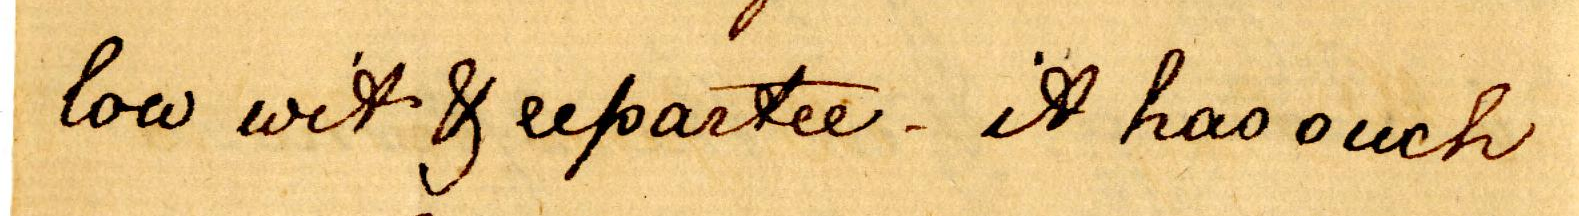low wit & repartee- it has such
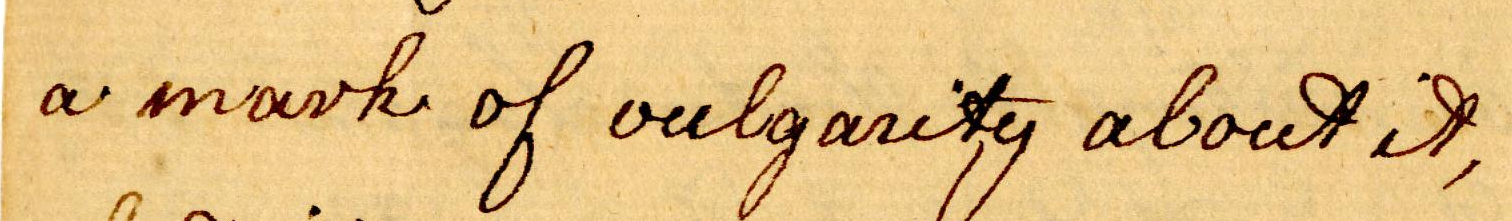a mark of vulgarity about it,
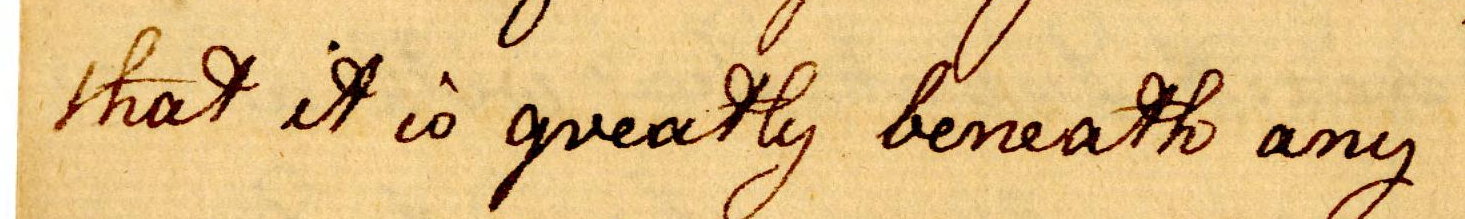that it is greatly beneath any
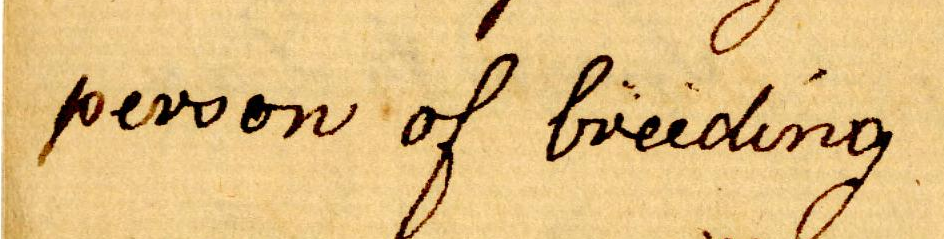person of breeding
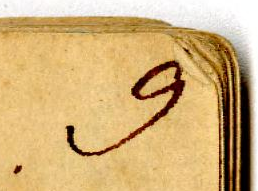9
